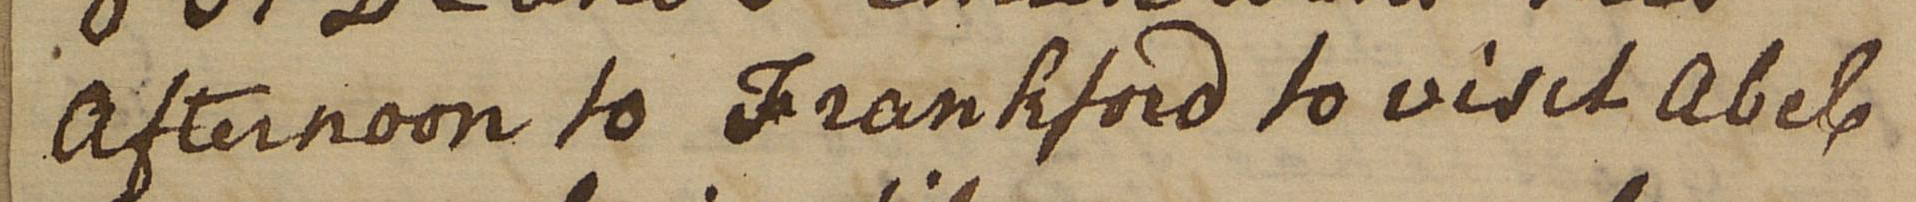Afternoon to Frankford to visit Abel
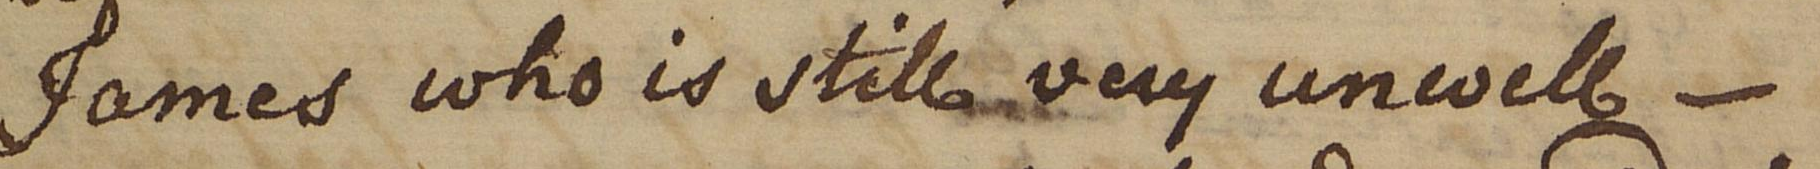James who is still very unwell-
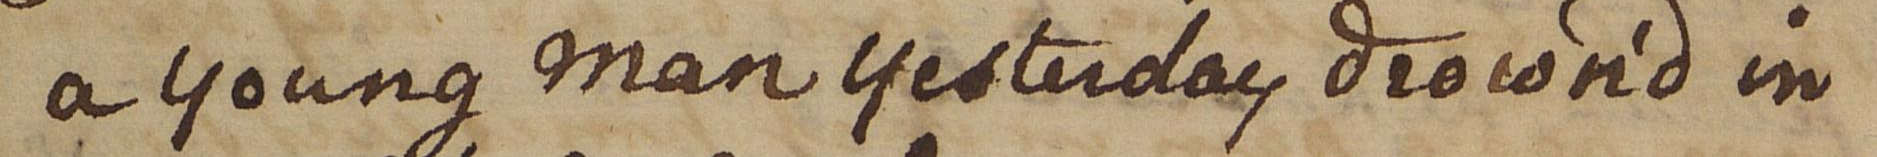a young man Yesterday drown'd in
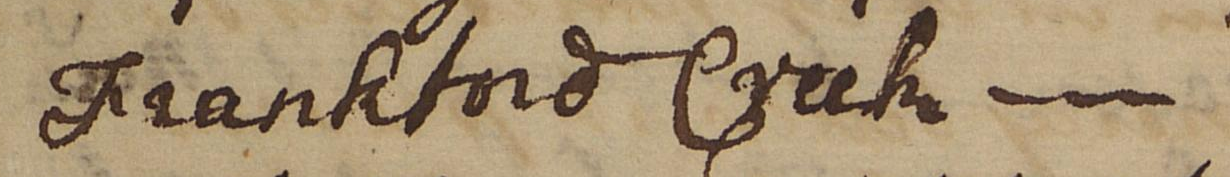Frankford Creek-
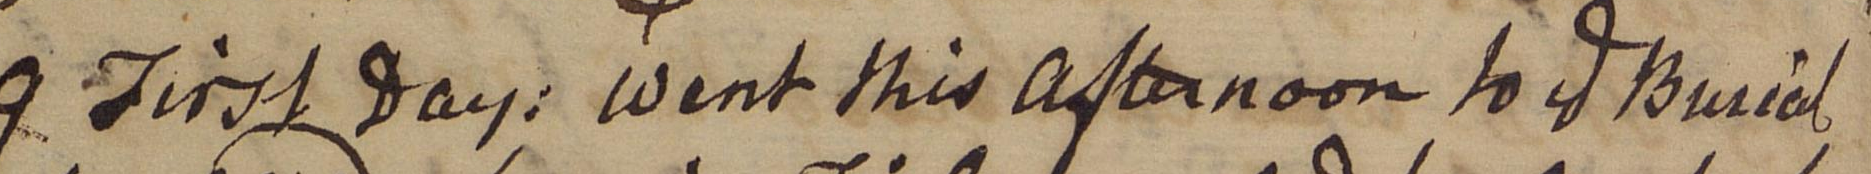9 First Day: went this afternoon to y^e Burial
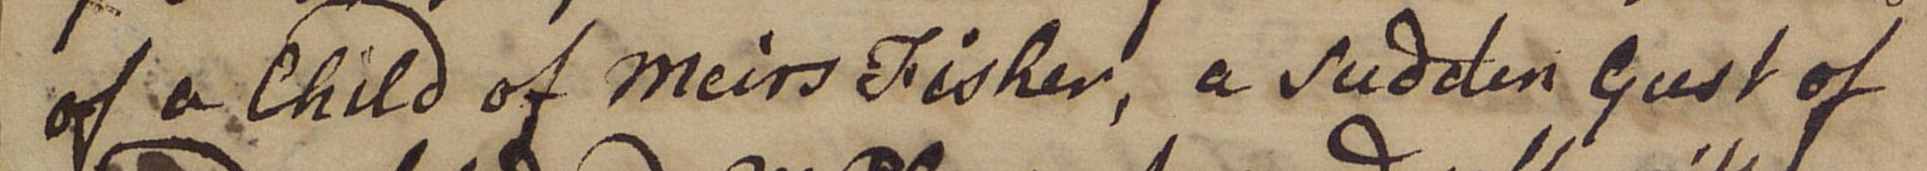of a Child of Meirs Fisher, a sudden Gust of
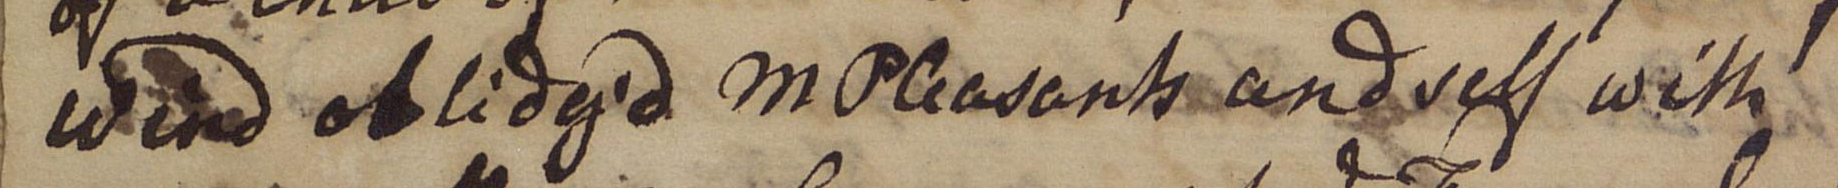Wind oblidg'd M Pleasants and self with
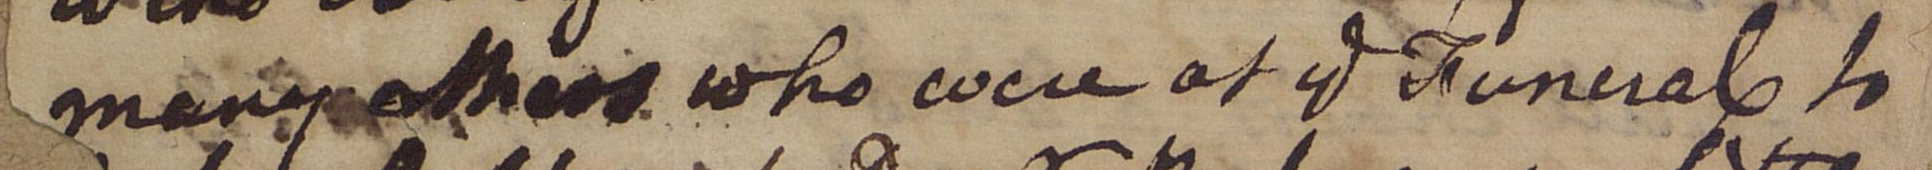many others who were at y^e Funeral to
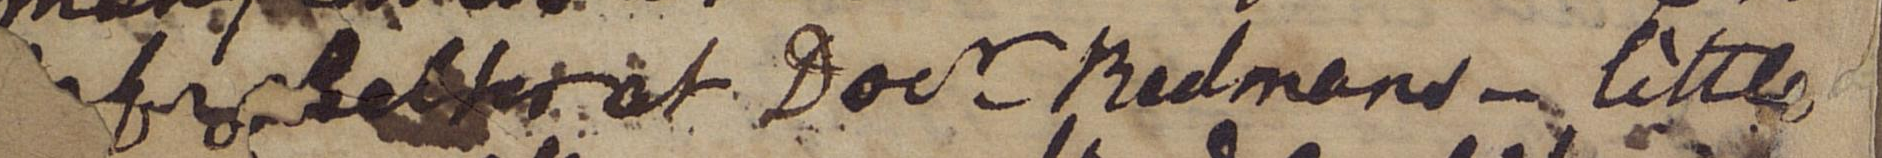[____] better at Doc^r Redmans- little
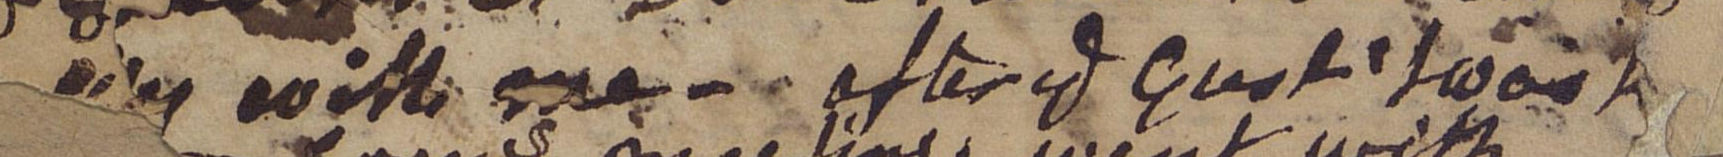[_]y with me- after y^e Gust I was
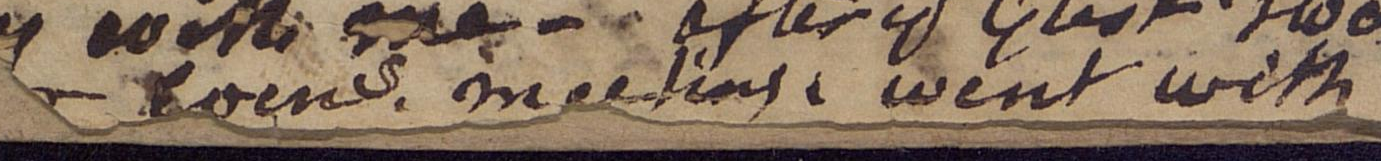- Even.^g meeting, went with
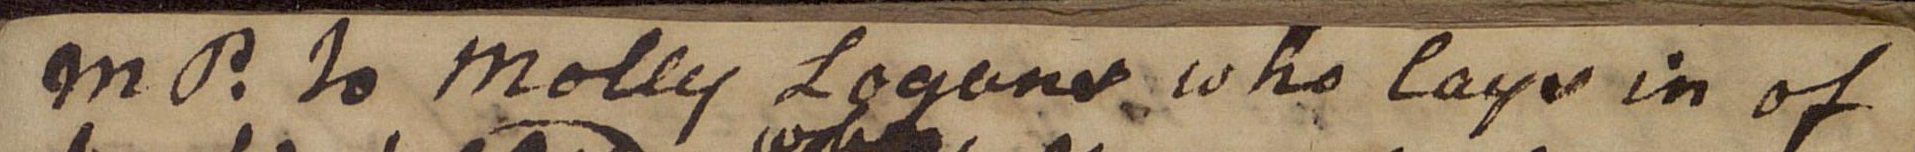MP. To Molly Logans who lays in of
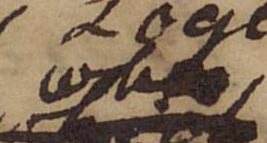who
